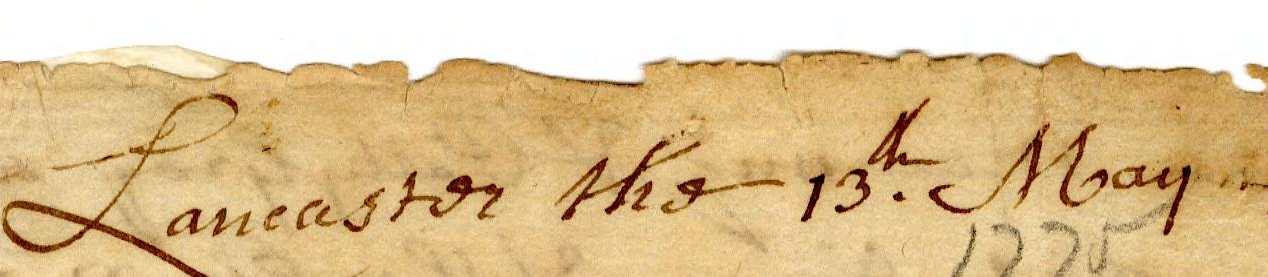Lancaster the 13^th. May
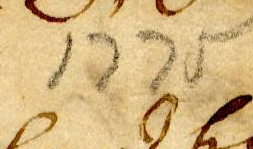1775
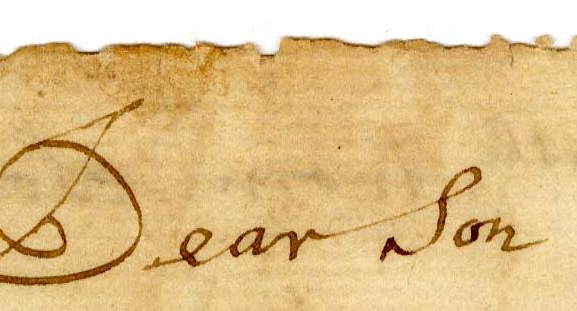Dear Son
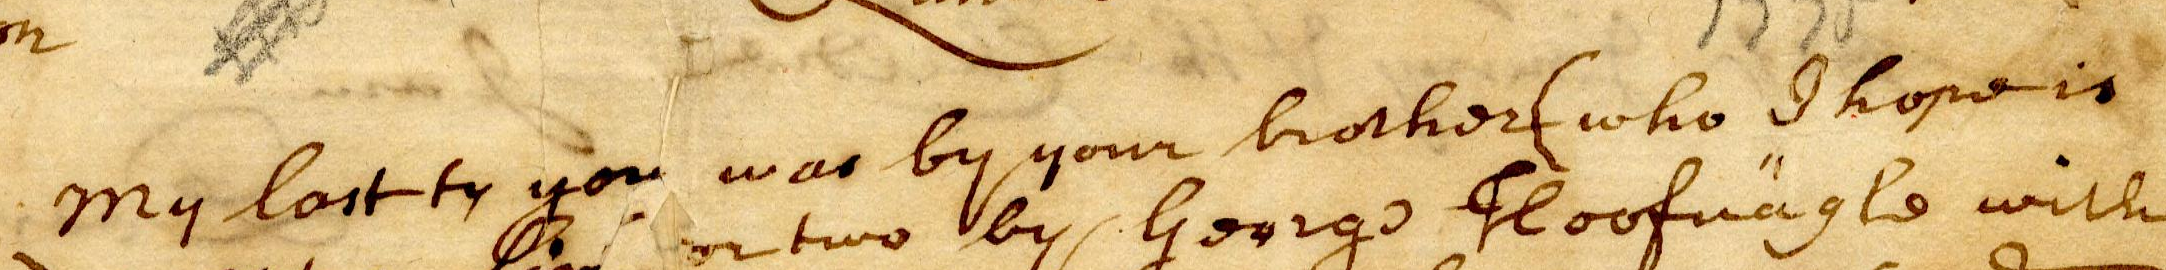My last fr you was by your brother (who I hope is
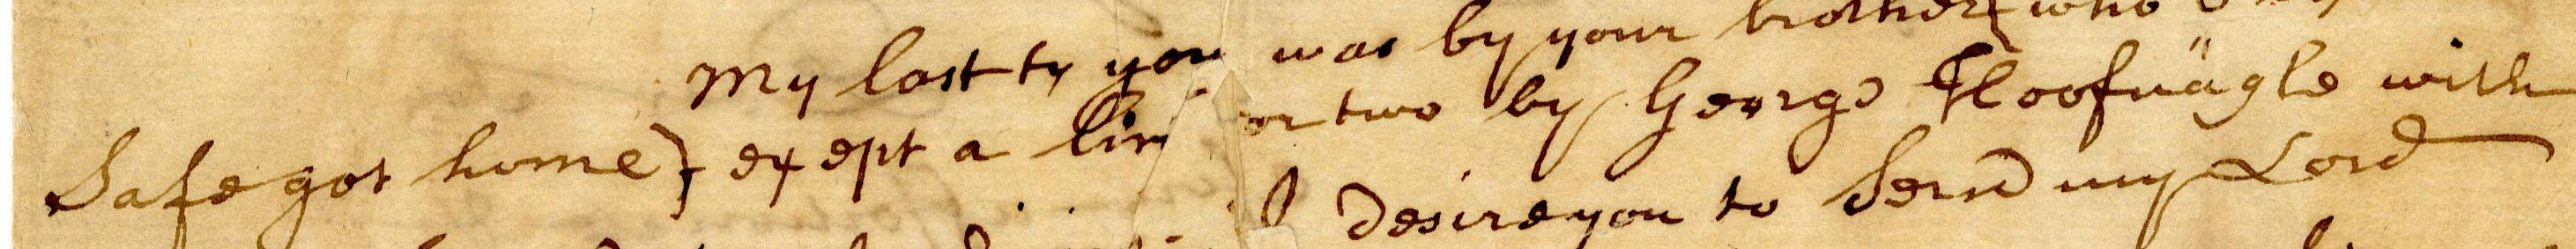Safe got home) exept a line or two by George Hoofnagle with
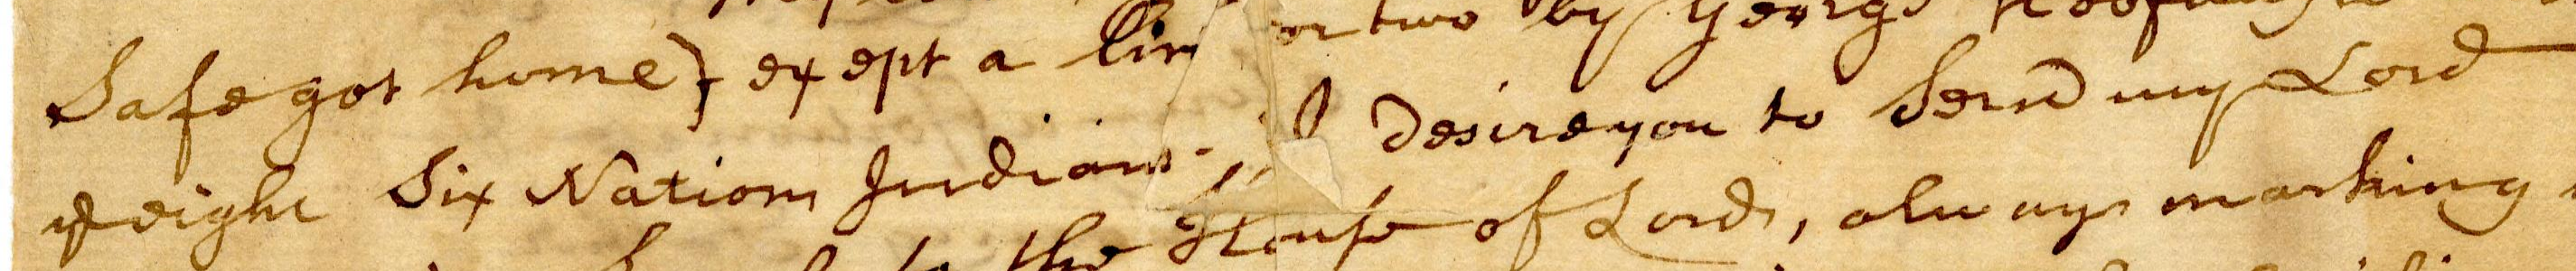if right Six Nation Indians-, I desire you to send my Lord
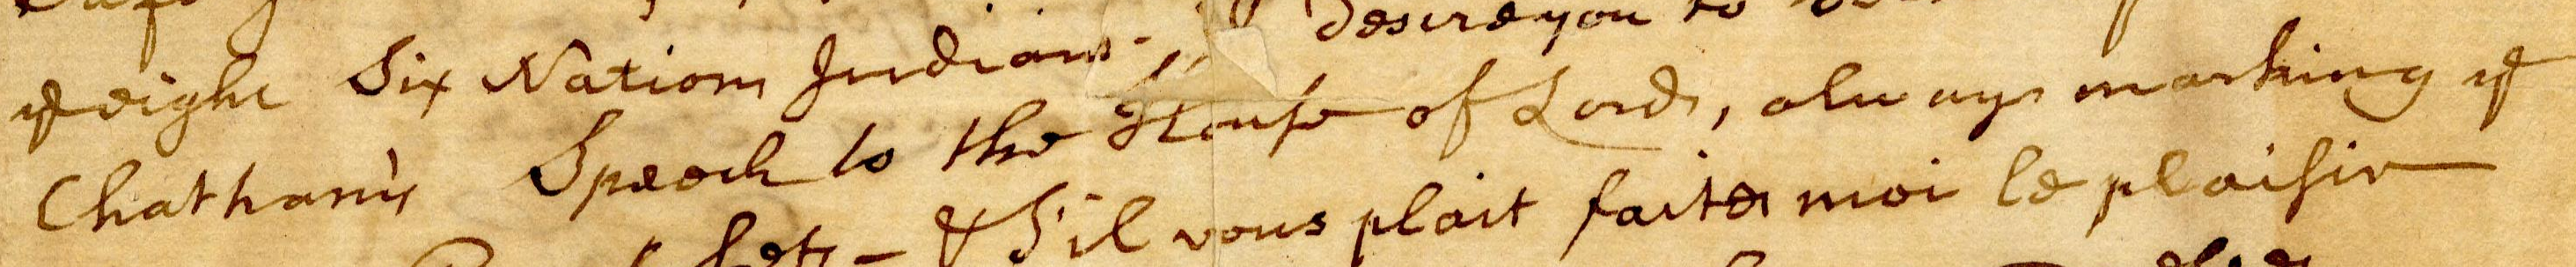Chatham's speech to the House of Lords, always marking of
